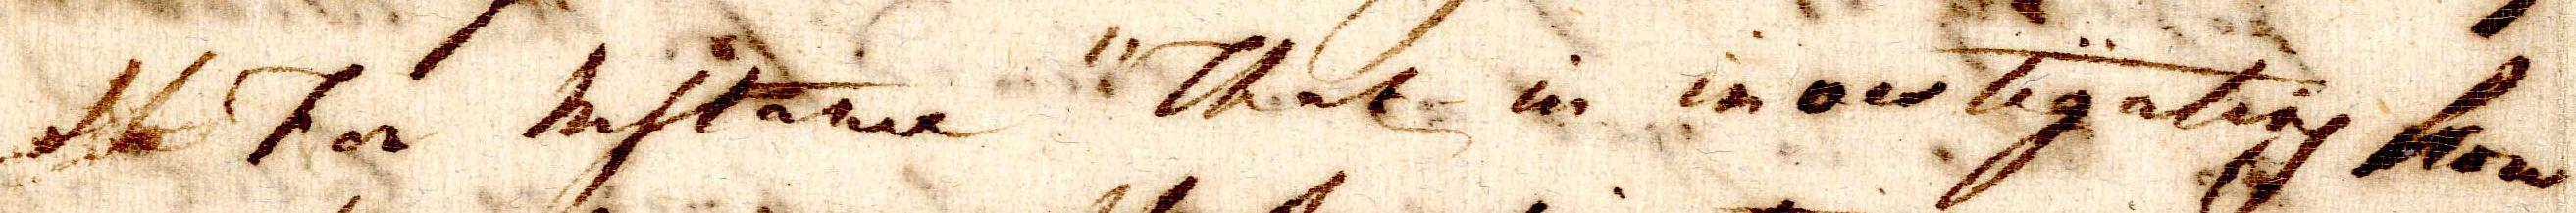the For instance "That in investigating how
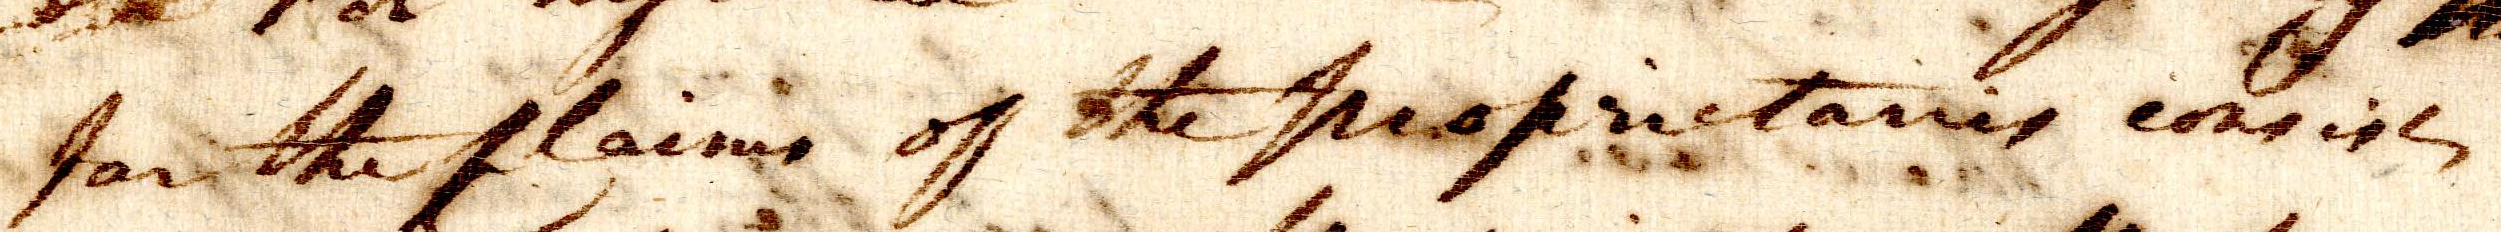far the Claims of the proprietaries consist
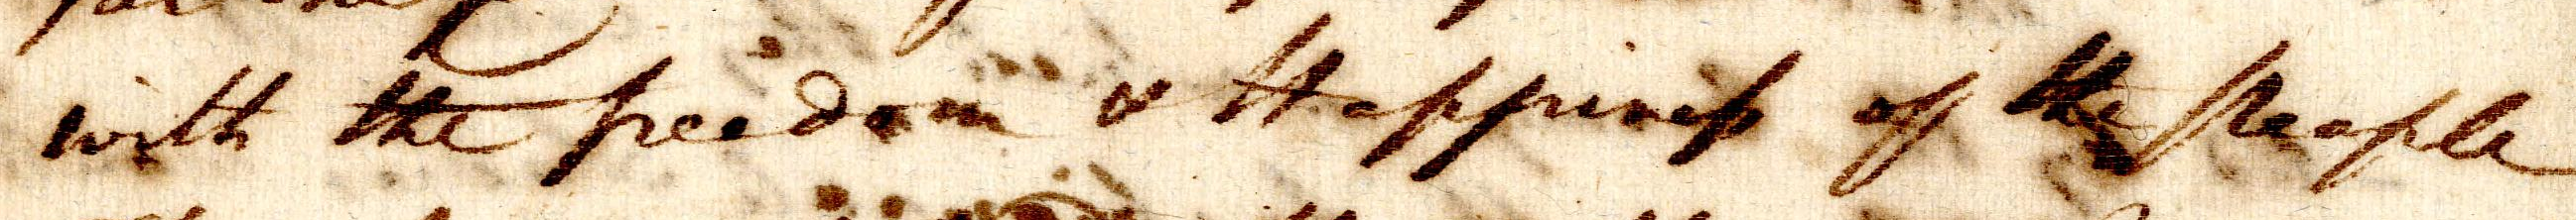with the freedom & happiness of the People
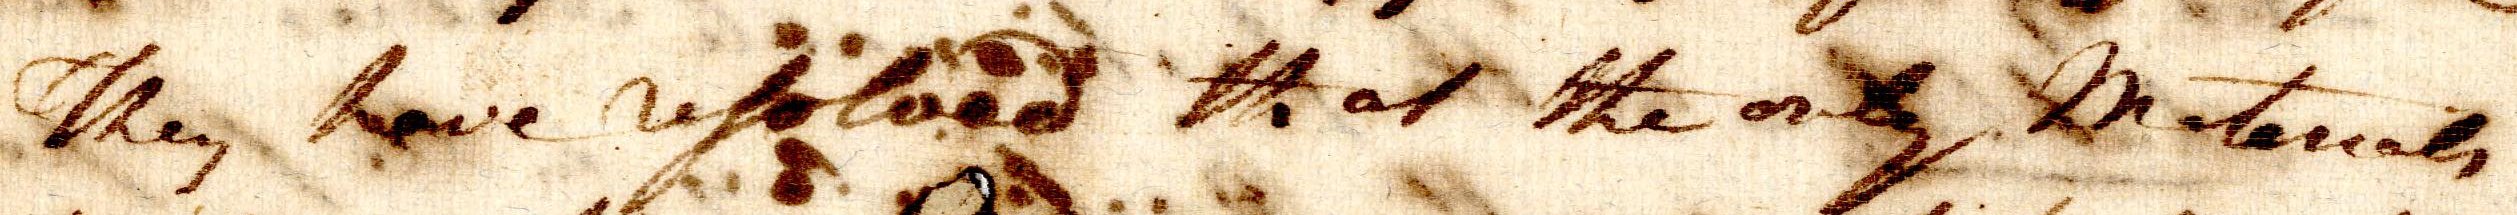They have resolved that the only Materials
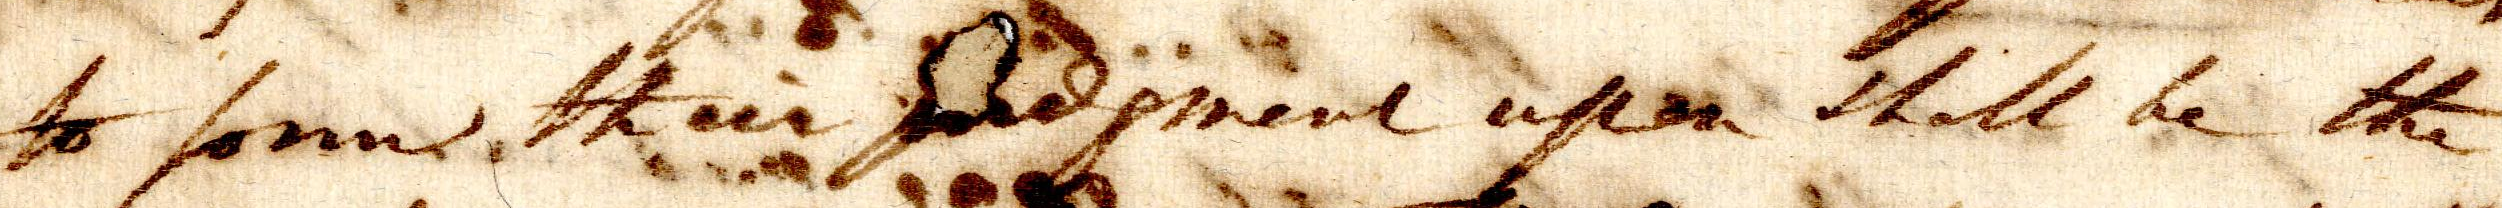to form their judgment upon shall be the
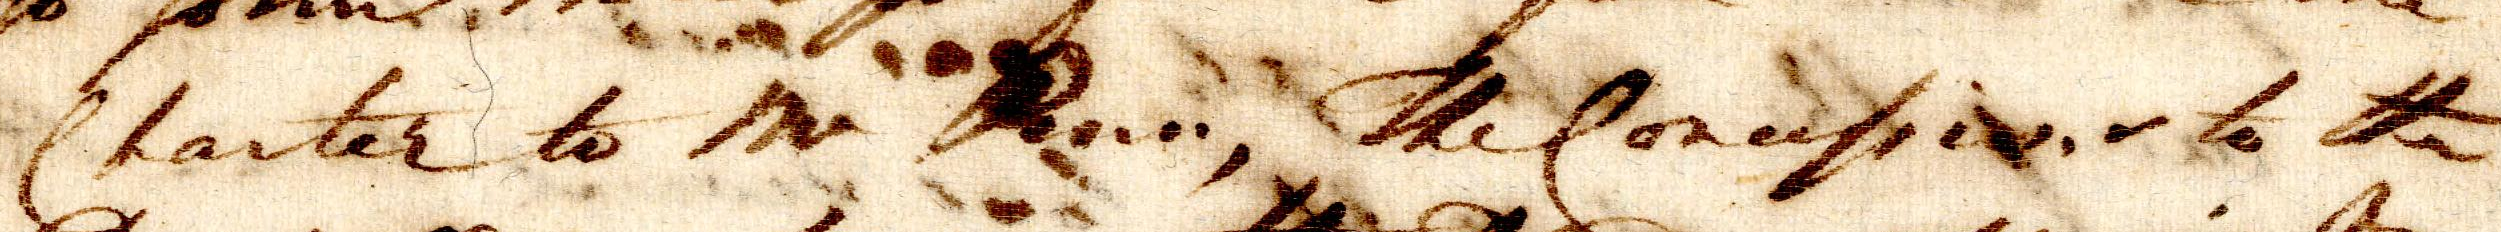Charter to M^r Penn. The Concession to the
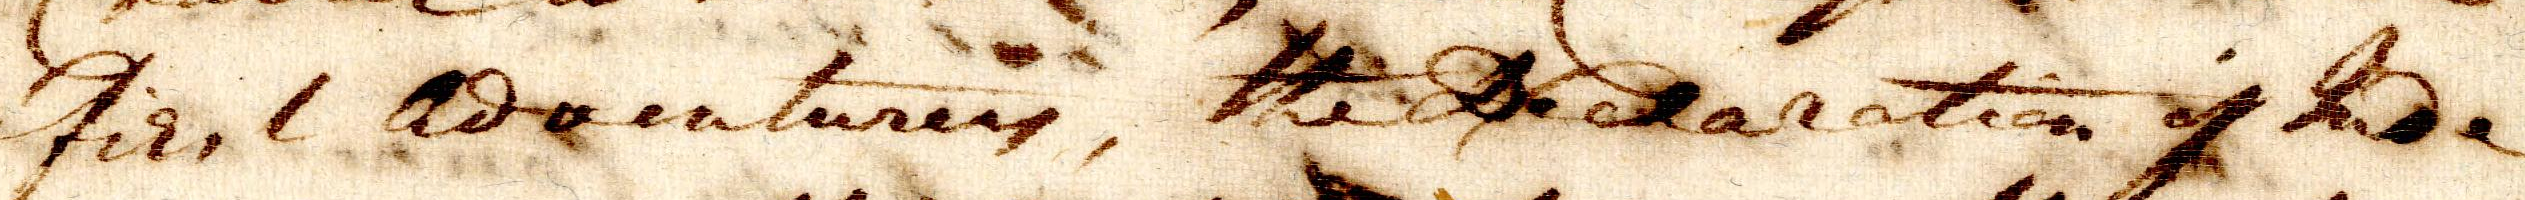First Adventurers, the Declaration of Inde-
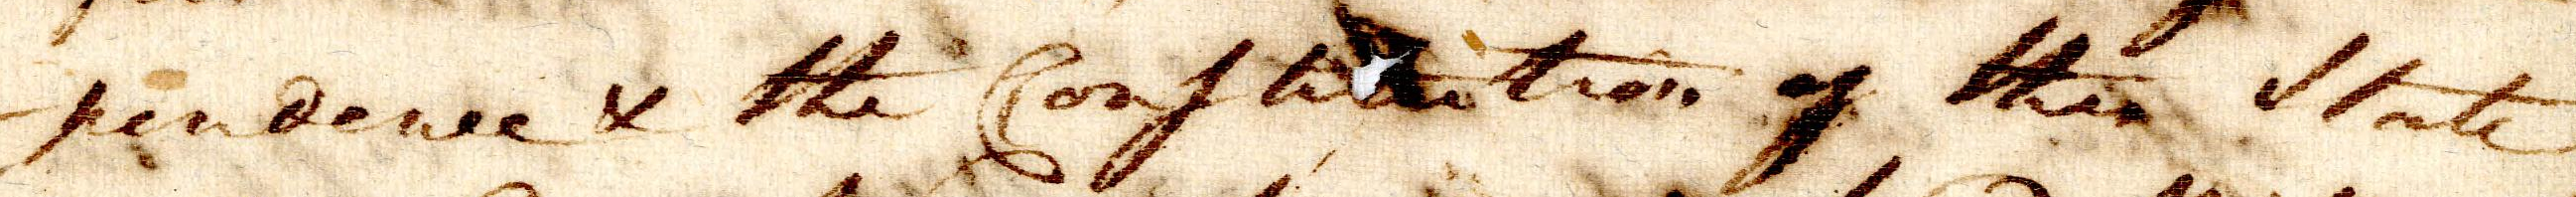-pendence & the Constitution of their State
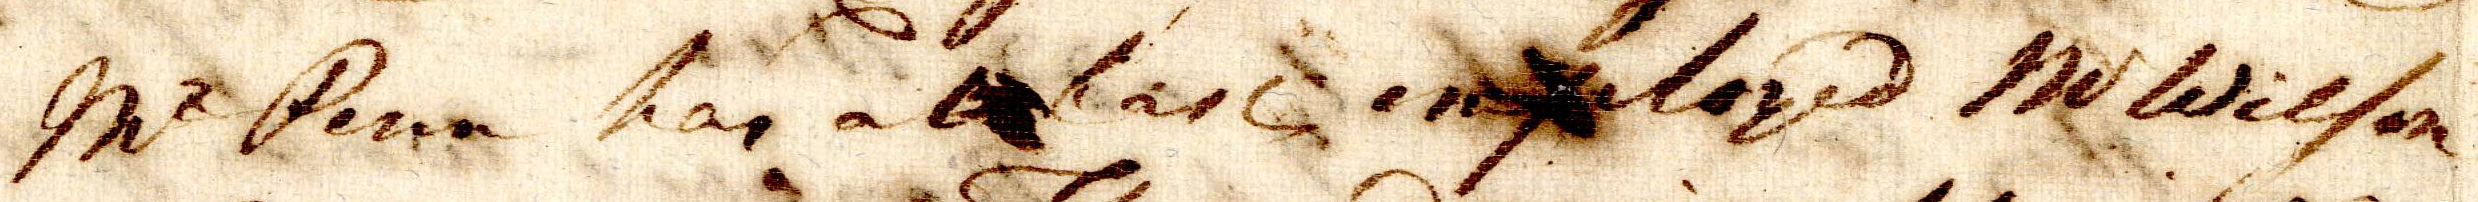M^r Penn has a [__]has employed M^r Wilson
